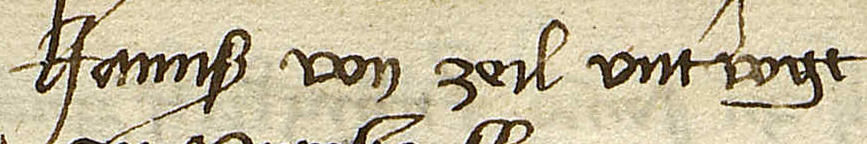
Hannſ* von ʒeil vnt*vogt
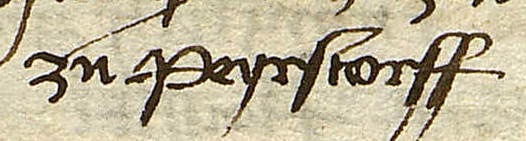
ʒu Peyrſtorff
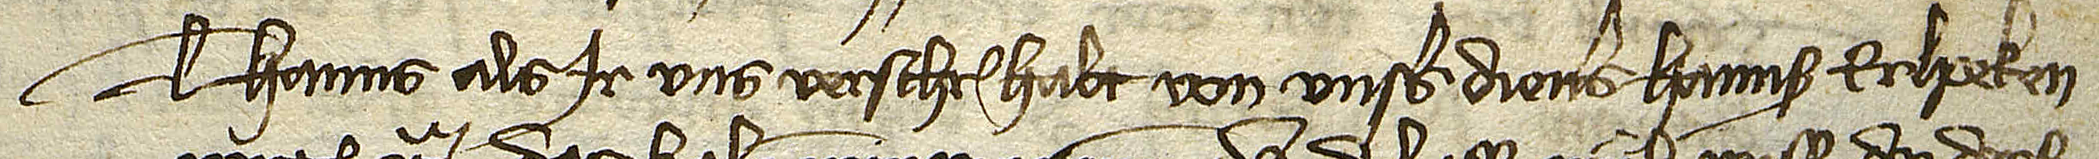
L* hanns als Ir vns verſchr* habt von vnſ*s dien*s hannſ* Erlpeken
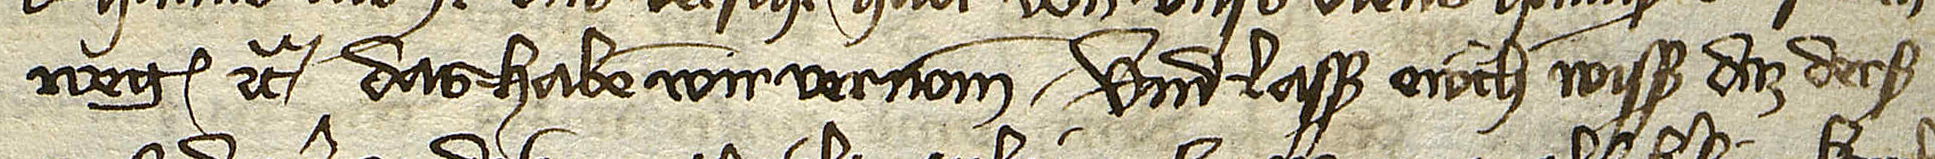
weg* ec* das habe* wir vernom* / Vnd laſſ* eẅch wiſſ* daʒ derſ*
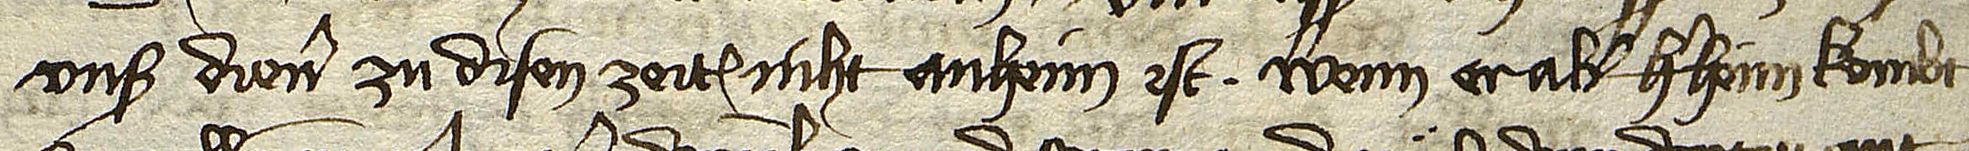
vnſ* dien* ʒu diſen ʒeit* niht anheim iſt . wenn er ab* h*heim kombt
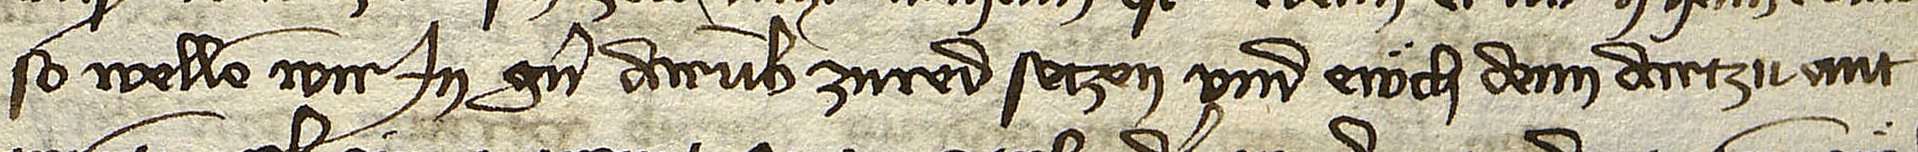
ſo welle* wir In g*n darub* ʒured ſecʒen vnd eẅch denn darcʒu ant =
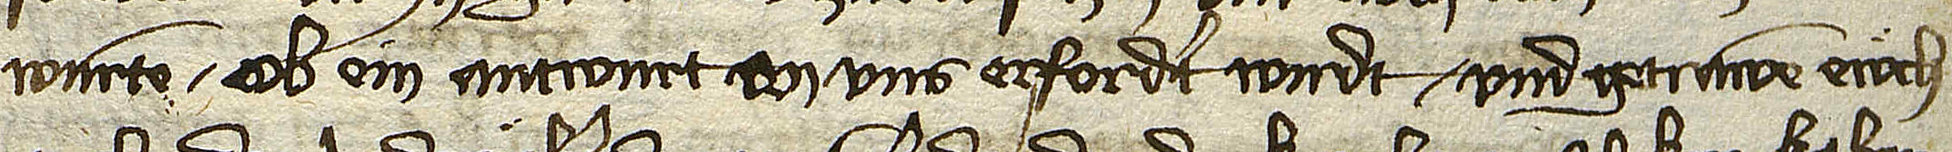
wurte* / ob ein antwurt von vns erford*t wirdt / vnd getrawe* eẅch
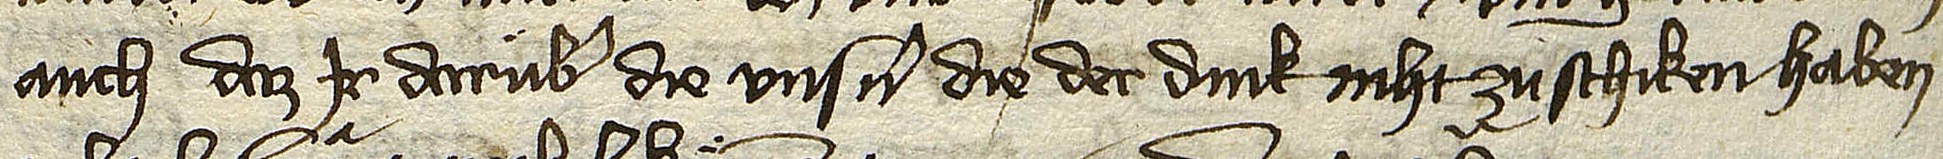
auch daʒ Ir darüb* die vnſ*n die der dink niht ʒu ſchicken haben
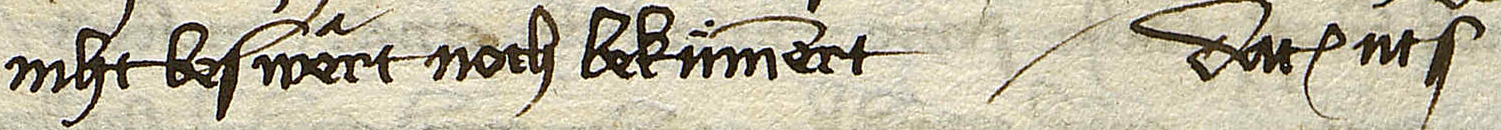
niht beſwërt nocht bekümert* / Dat* ut ſ*
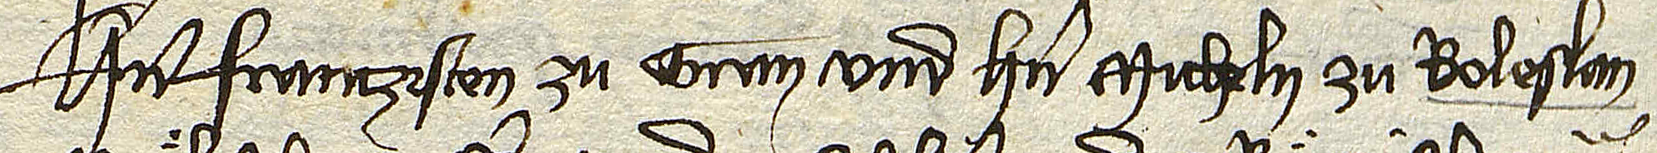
H*n francʒiſten ʒu Gran vnd h*n Micheln ʒu Boleſlan
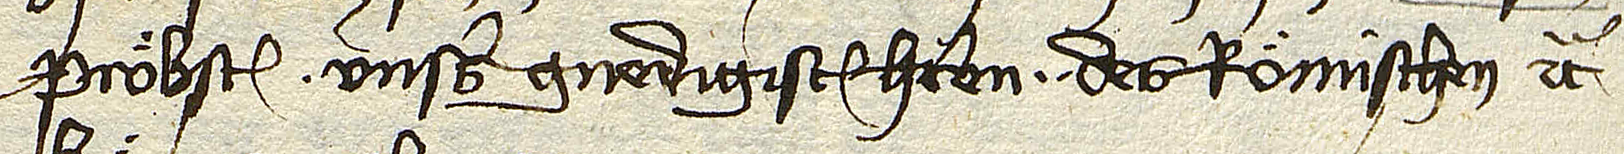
Pröbſt* . vnſ*s gnedigiſt* h*ren ~ des Römiſchen ec*
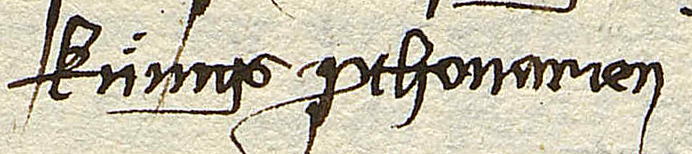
künigs p*thonarien
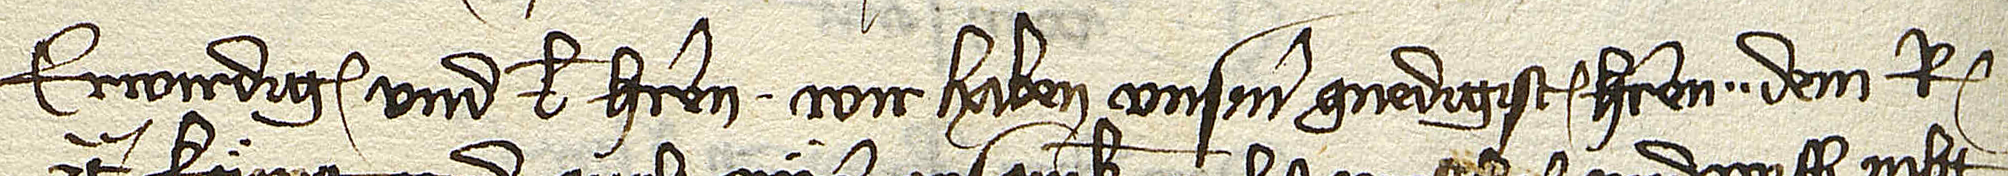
Erwirdig* vnd l* h*ren . wir haben vnſ*m gnedigiſt* h*ren ~ dem R*
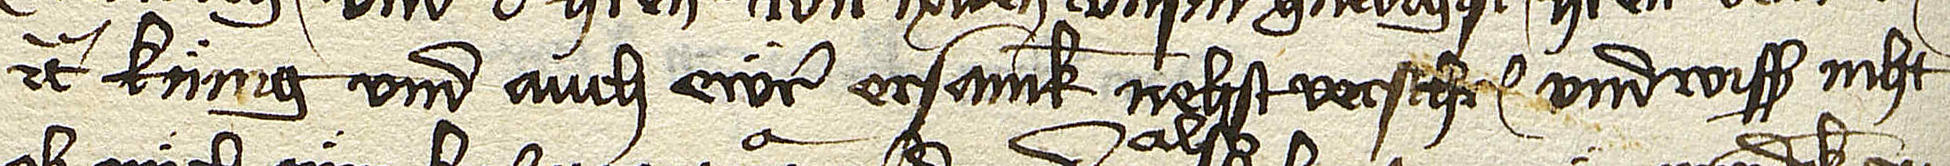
ec* künig vnd auch eẅr* erſamk* nehſt verſchr* vnd wiſſ* niht
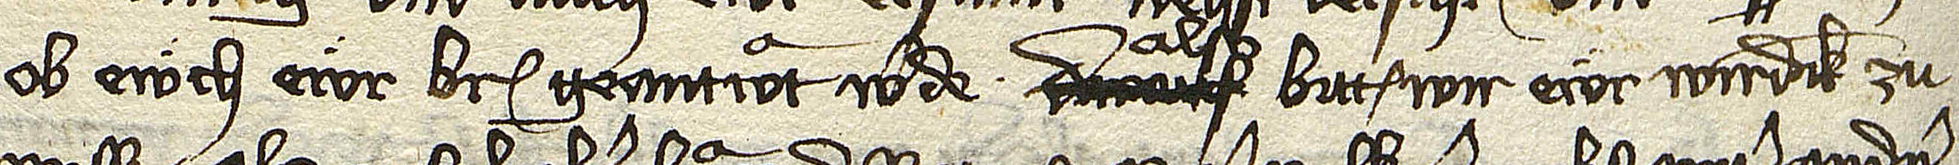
ob eẅch eẅr br* geantw*t w*de . Darauf bitt* wir eẅr wirdik* ʒu
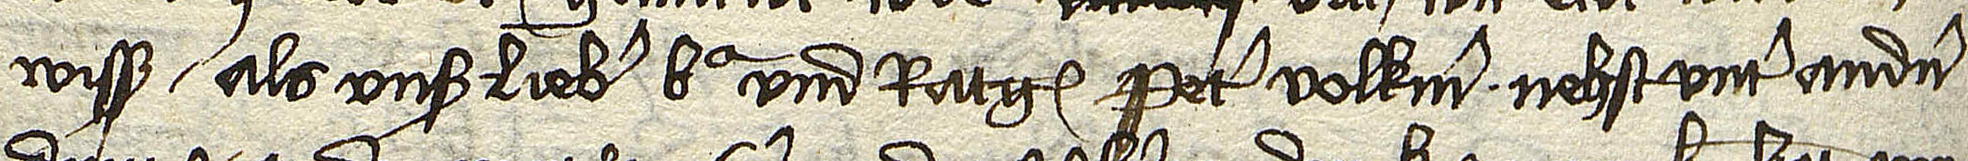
wiſſ* / als vnſ* lieb* b* vnd Ratg* Pet* volkm* . nehſt vnt* and*n
